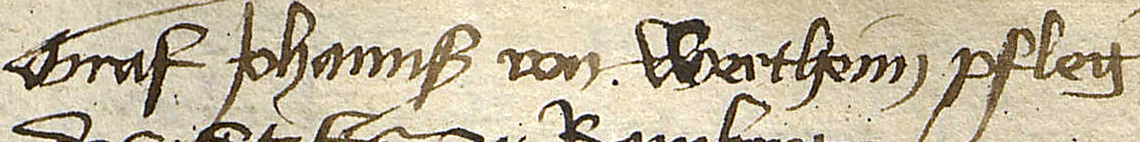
Graf Iohannſ* von Wertheim pfleg*
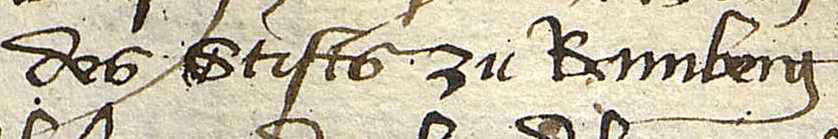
des Stifts ʒu Bamberg
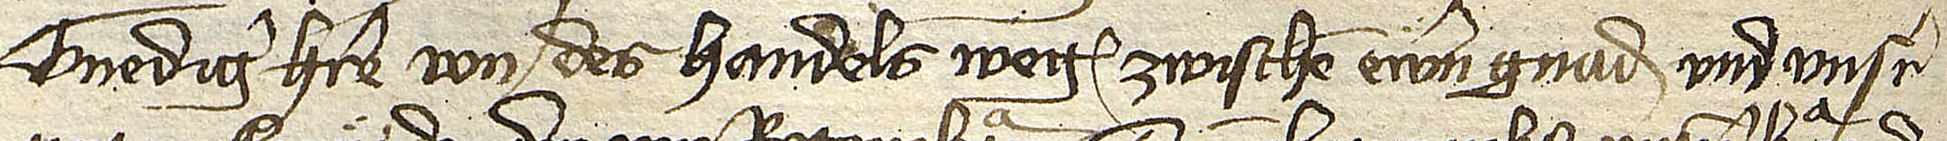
Gnedig* h*re von des handels weg* ʒwiſche* eẅ*n gnad* vnd vnſr*
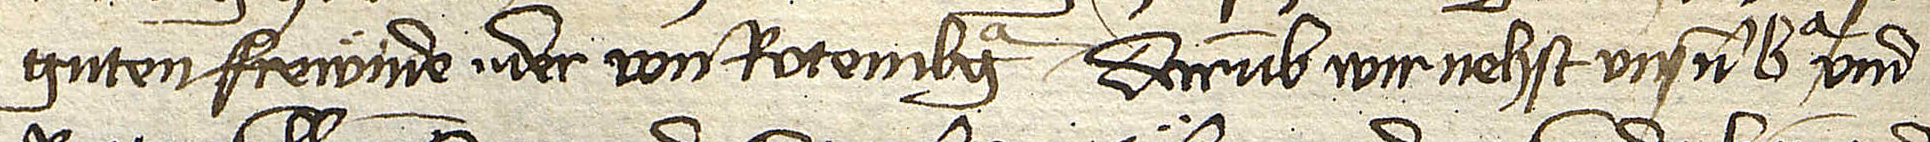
guten freẅnde ~ der von Rotemb*g / Darub* wir nehſt vnſn* b* vnd
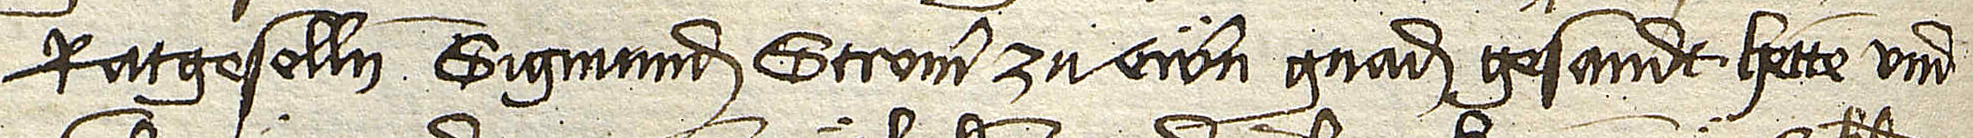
Ratgeſelln* Sigmund* Strom* ʒu eẅ*n gnad* geſandt hette* vnd
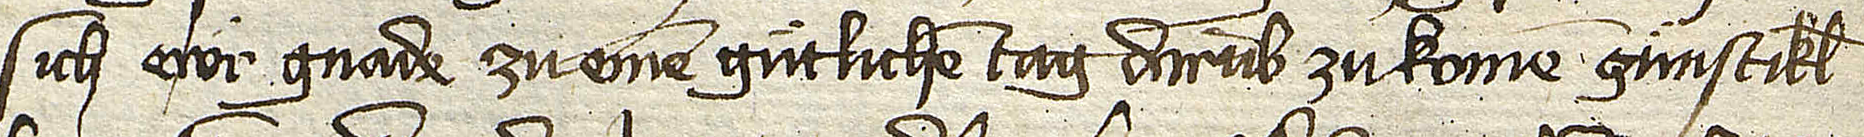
ſich eẅr gnade ʒu eine* gütliche* tag darub* ʒu kome* günſtikl*
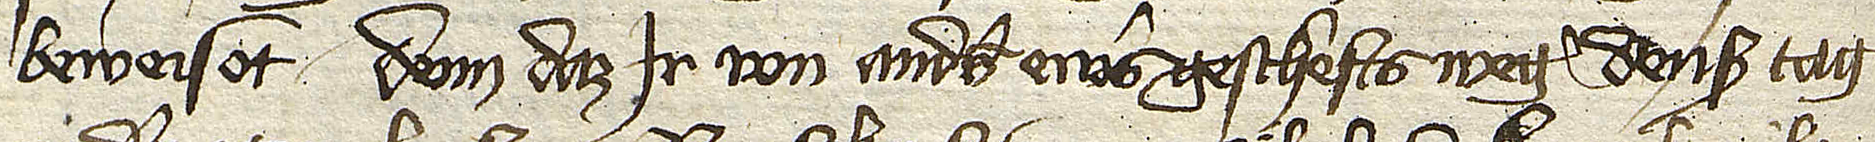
beweiſet / Denn daʒ Ir von and*s ew*s geſchefts weg* denſ* tag
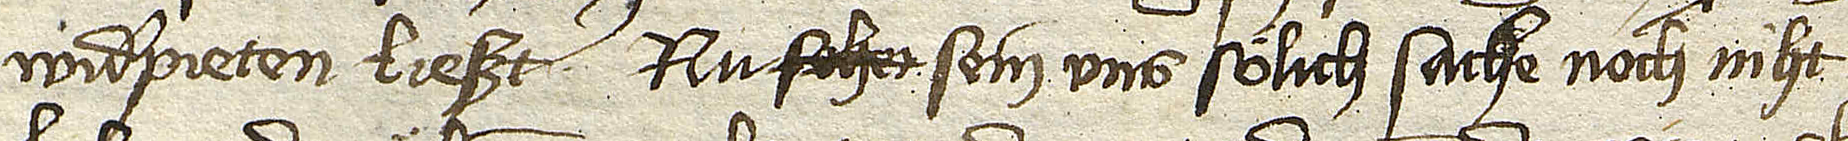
wid*pieten lieſʒt . Nu ſehen ſein vns ſölich ſache noch niht
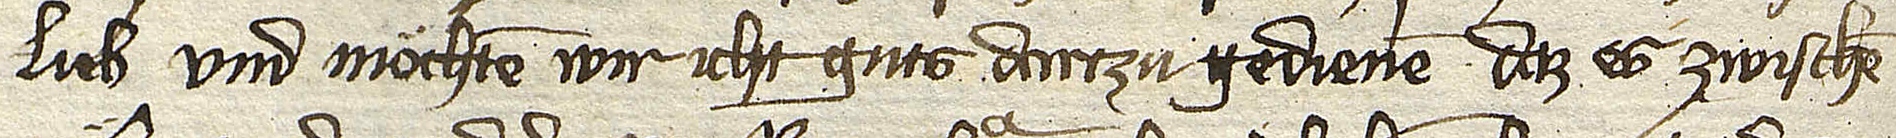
lieb vnd möchte* wir icht guts darcʒu gediene* . daʒ es ʒwiſche*
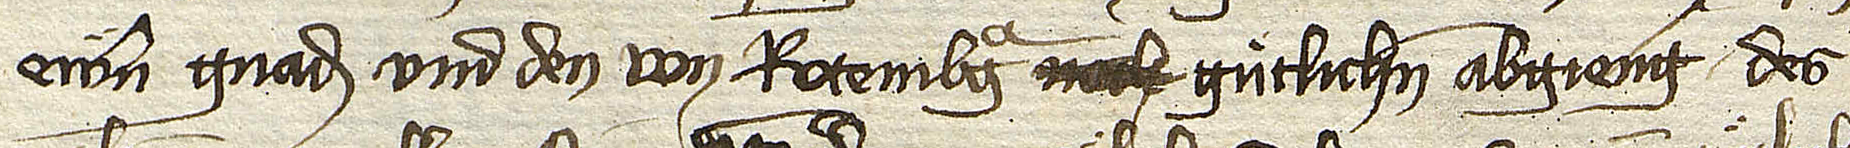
eẅ*n gnad* vnd den von Rotemb*g noch gütlichn* abgieng / des
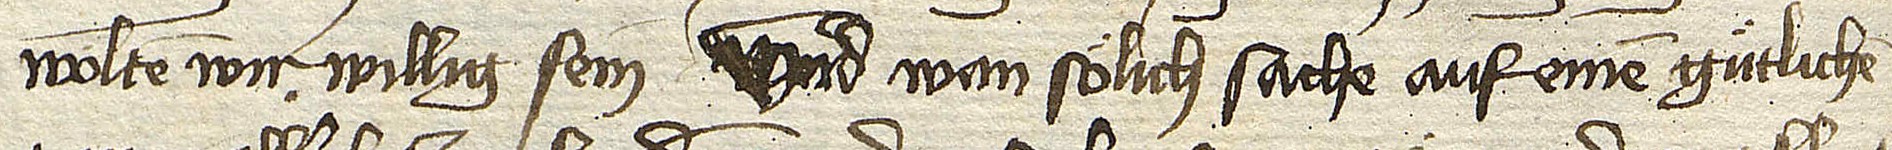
wolte* wir willig ſein / Vnd wan ſölich ſache auf eine* gütliche*
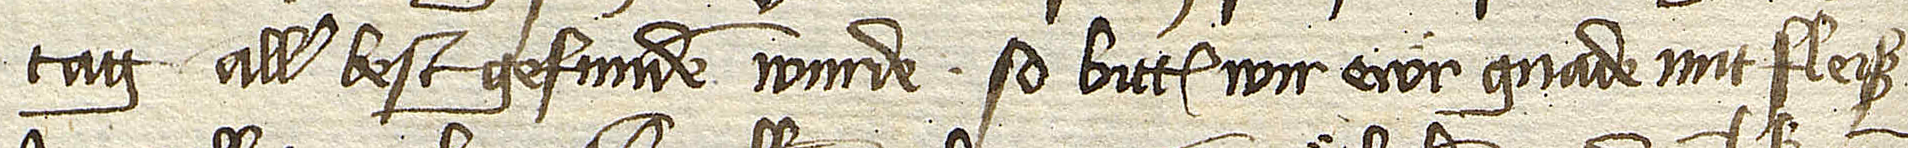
tag / all* beſt gefunde* wurde . ſo bitt* wir eẅr gnade mit fleiſʒ
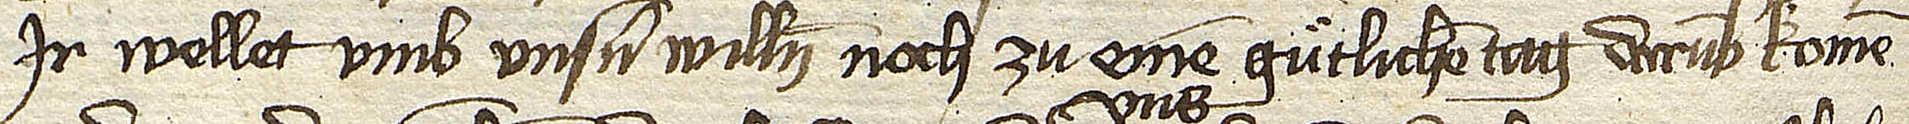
Ir wellet vmb vnſn* willn* noch ʒu eine* gütliche* tag darub* kome*
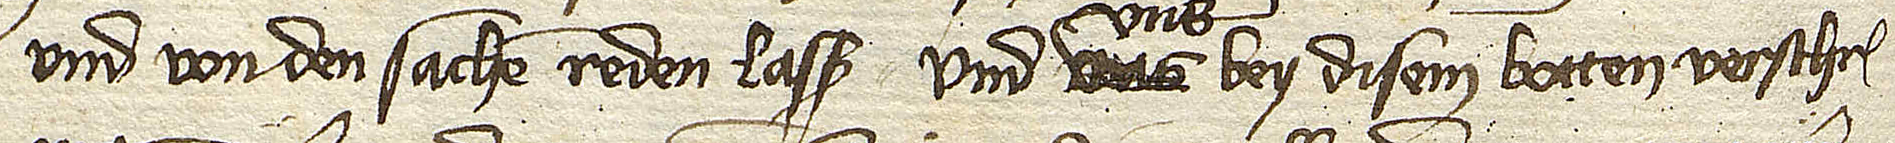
vnd von den ſache* reden laſſ* vnd Vns bey diſem botten verſchr*
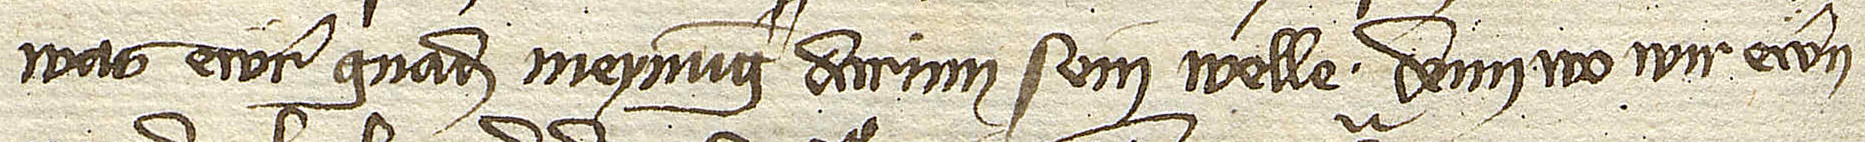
was eẅr* gnad* meynu*g darinn ſein welle . Denn wo wir eẅ*n
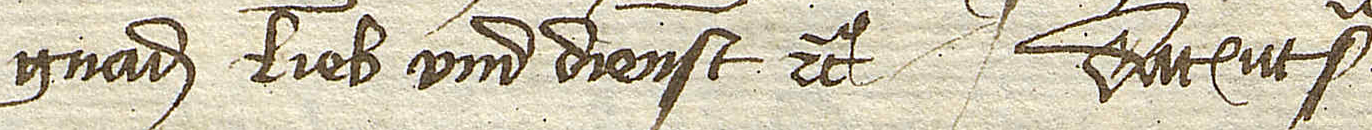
gnad* lieb vnd dienſt ec* / Dat* ut ſ*
